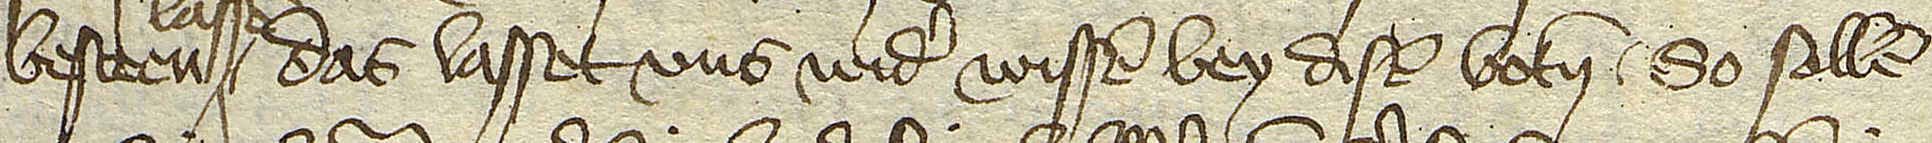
beſteen / Das laſſet vns wid* wiſſe* bey diſe* botn* / So ſolle*
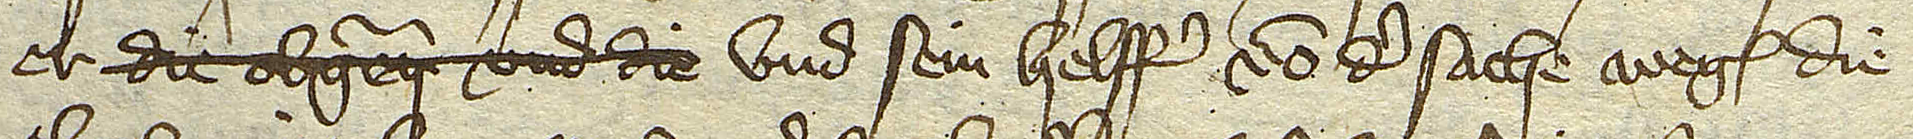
er die obgen* vnd die vnd ſein helff* vo* d* ſache weg* die
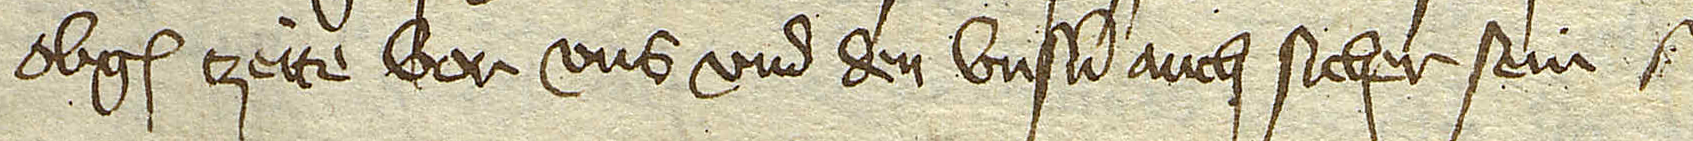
obg* cʒeite vor vns vnd den vnſn* auch ſicher ſein /
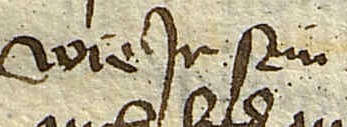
wie Ir ſein
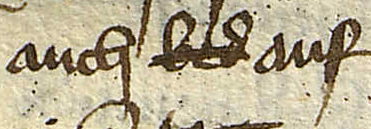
auch bed auf
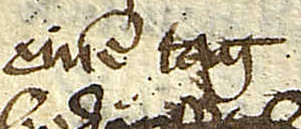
eine* tag
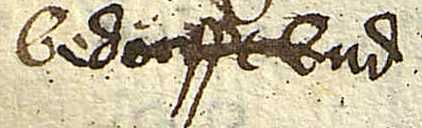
bedörfft vnd
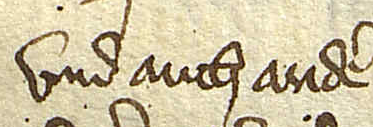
vnd auch and*
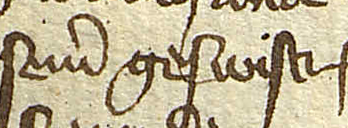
ſein* geſwiſtr*
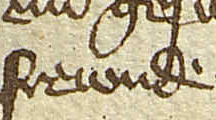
frewnde
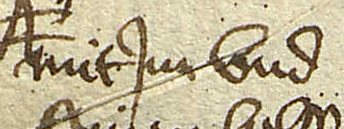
mit Im vnd
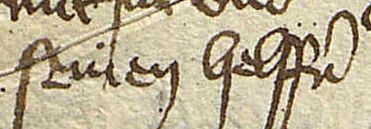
ſeinen helffn*
